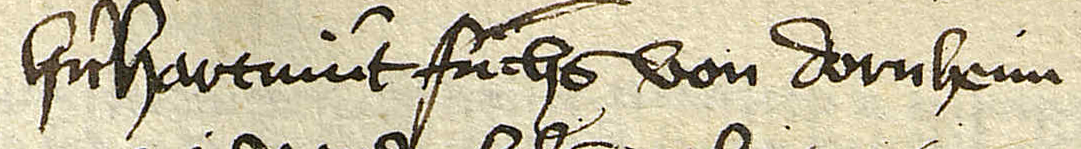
hn* hartmüt fuchs von dornheim
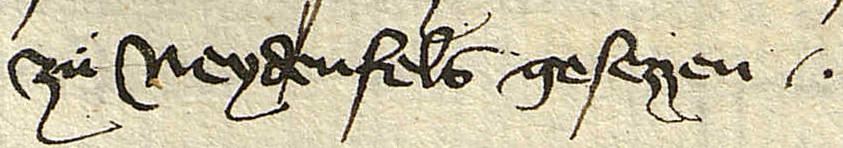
cʒü Neydenfels geſeʒʒen / .
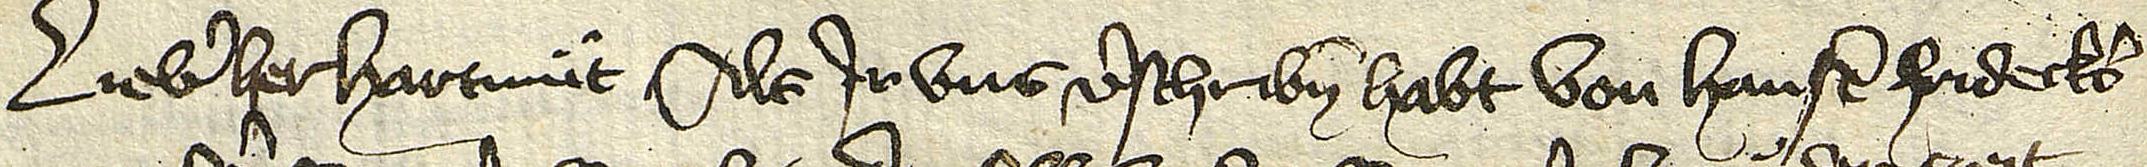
Lieb* her hartmüt / Als Ir vns v*ſchribn* habt von hanſe* Fridecks*
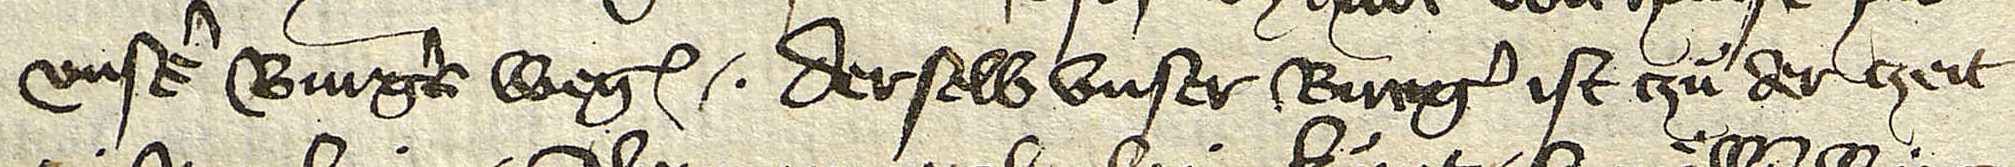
vnſs* Burg*s weg* / . derſelb vnſer Burg* iſt cʒü der cʒeit
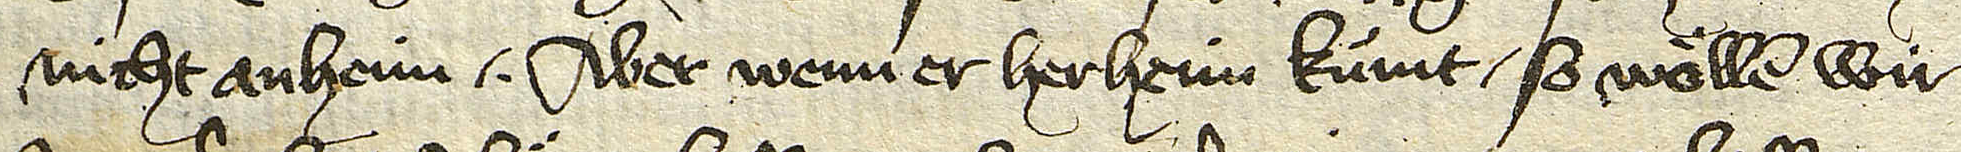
nicht anheim / . Aber wenn er herheim kümt / ſo wölle* wir
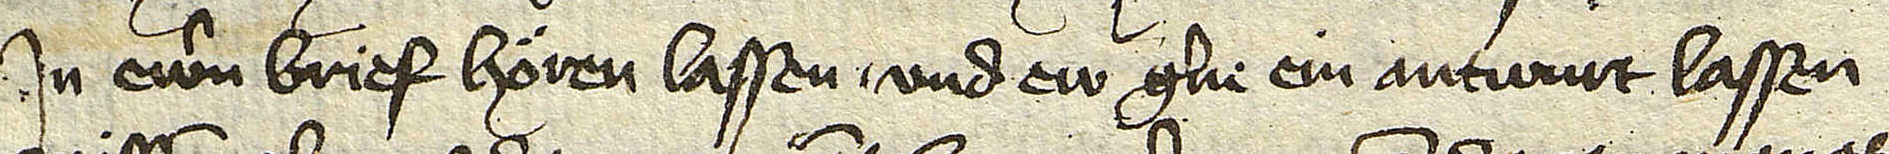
In ew*n brief hören laſſen / vnd ew g*ne ein antwurt laſſen
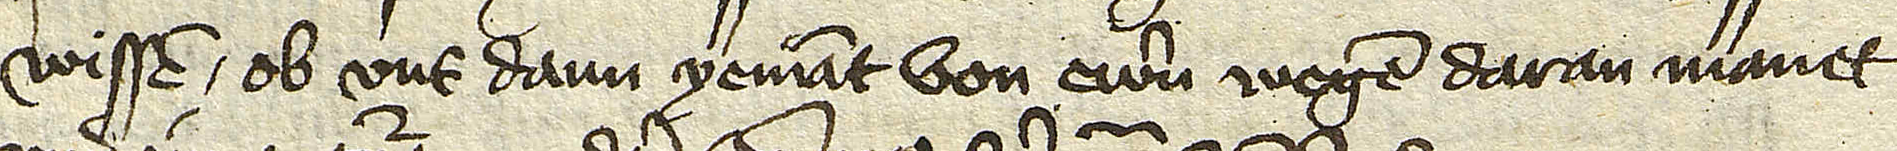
wiſſe* / ob vns dann yemat* von ew*n wege* daran manet
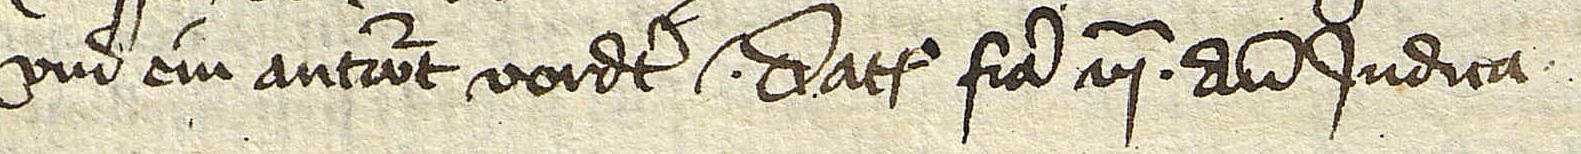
vnd ein antw*t vordt* / . Dat* fia* vi* . An* Iudica
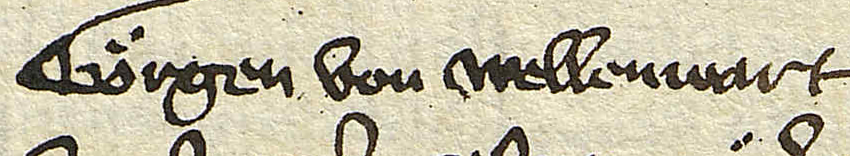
Görgen von wellenwart
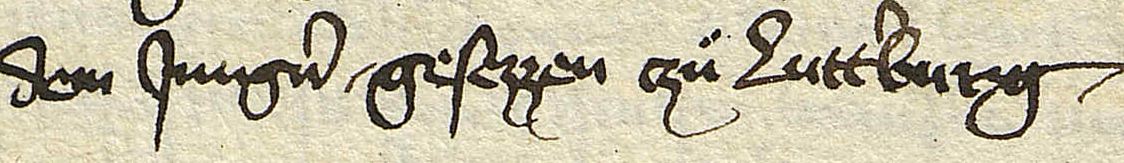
dem Iungn* / geſeʒʒen cʒü Lutt*burg
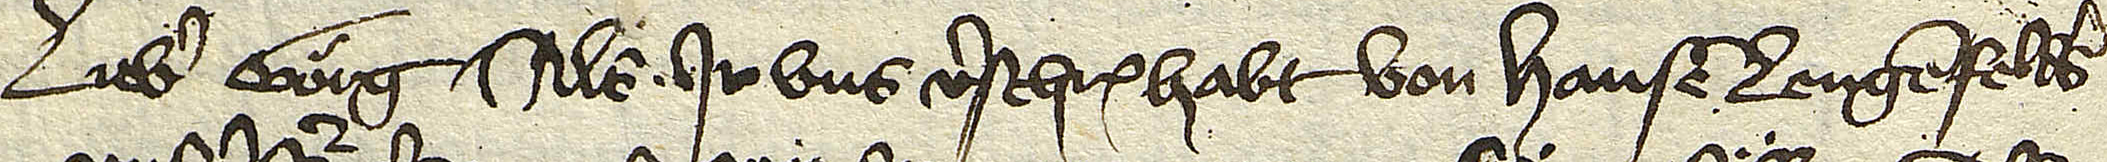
Lieb* Görg / Als Ir vns v*ſchr* habt von hanſe Lenge*felds*
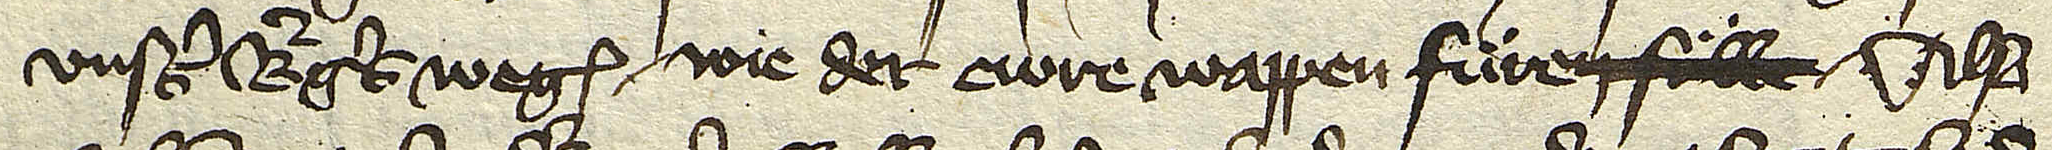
vnſs* B*g*s weg* / wie der ewre wappen füren ſülle / Alſo
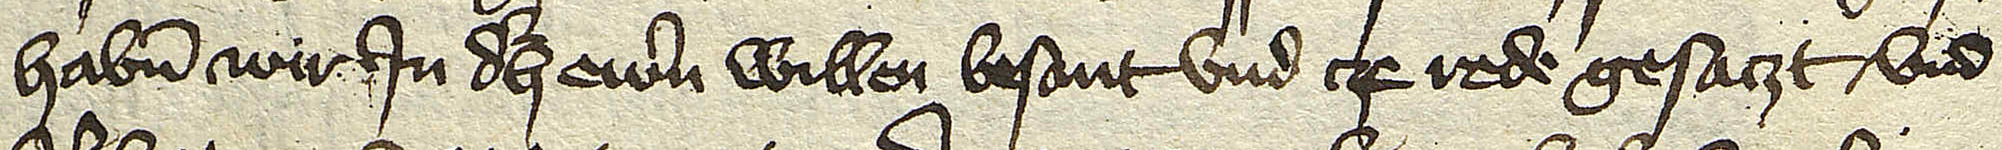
habn* wir In d*h ew*n willen beſant vnd cʒe rede geſacʒt / vnd
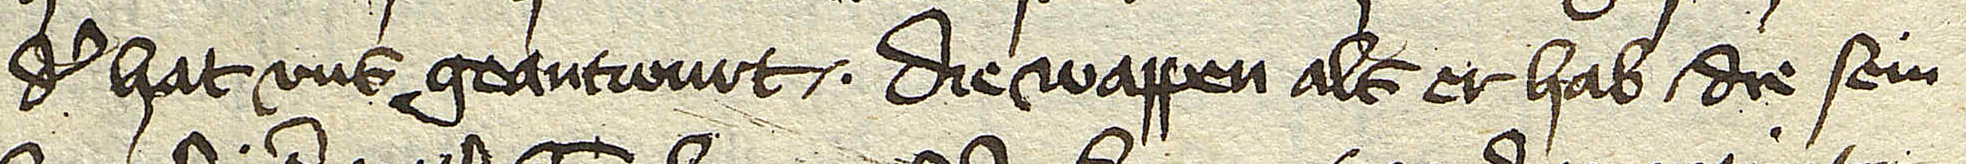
d* hat vns geantwurt / . die wappen als er hab / die ſein
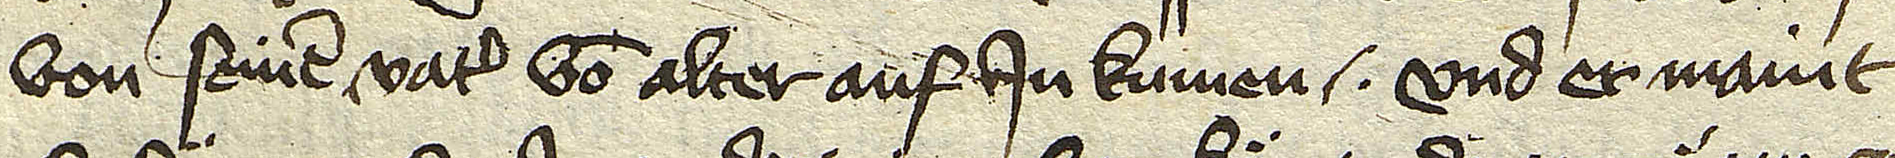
von ſeine* vat* vo* alter auf In kumen / . vnd er maint
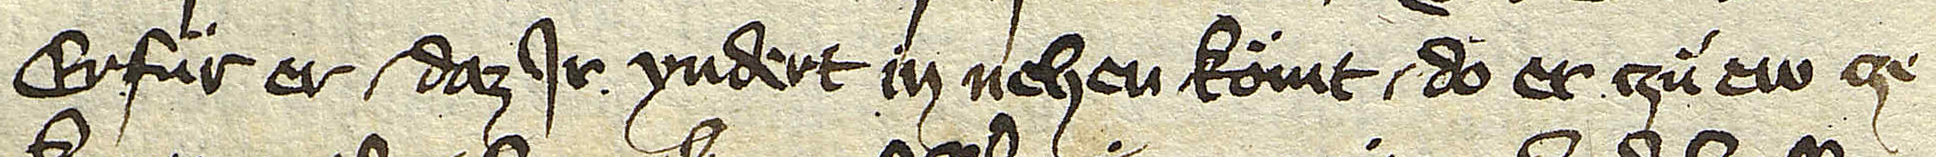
Erfür er / daʒ Ir yndert in nehen kömt / do er cʒü ew cʒe
